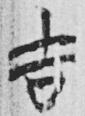吉
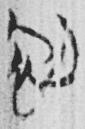初
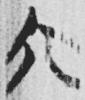六
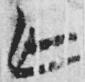亡
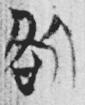咎
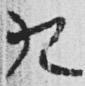九
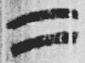二
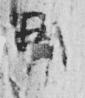畋
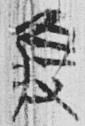○（獲）
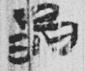晶（三）
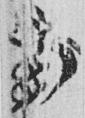○（狐）
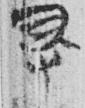○（得）
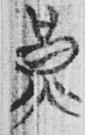黃
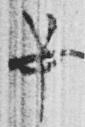矢
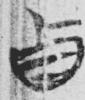貞
